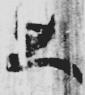也
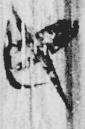女（如）
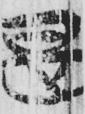是
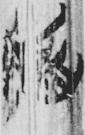○（狀）
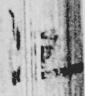也
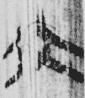文
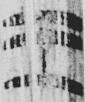王
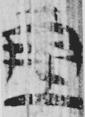堋（崩）
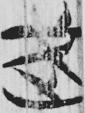武
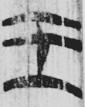王
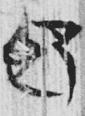即
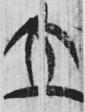立（位）
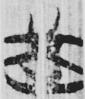武
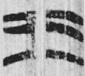王
